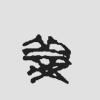義
